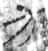方
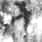七
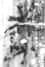麋
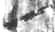一
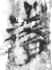○（巂）
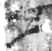五
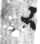又
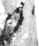六
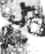來
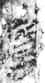○（巂）
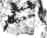四
